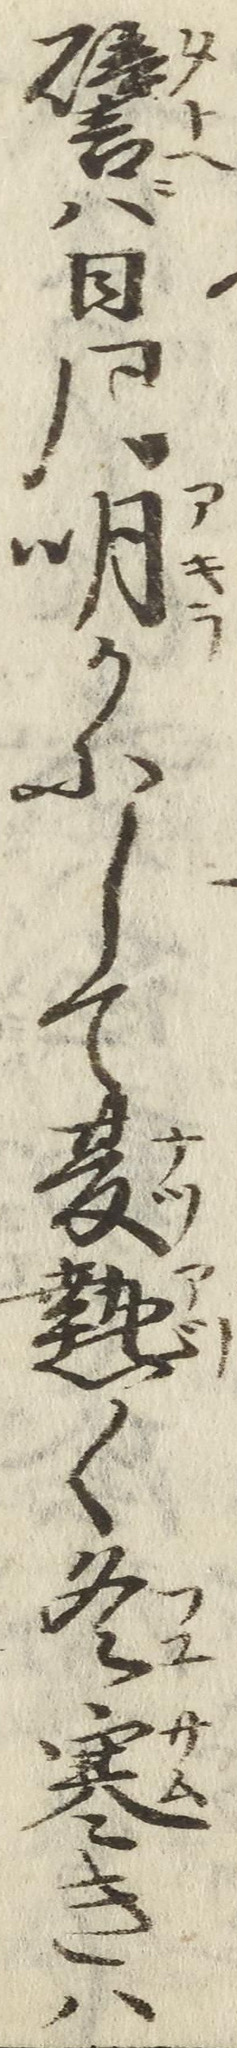譬ば日月明かにして夏熱く冬寒きは
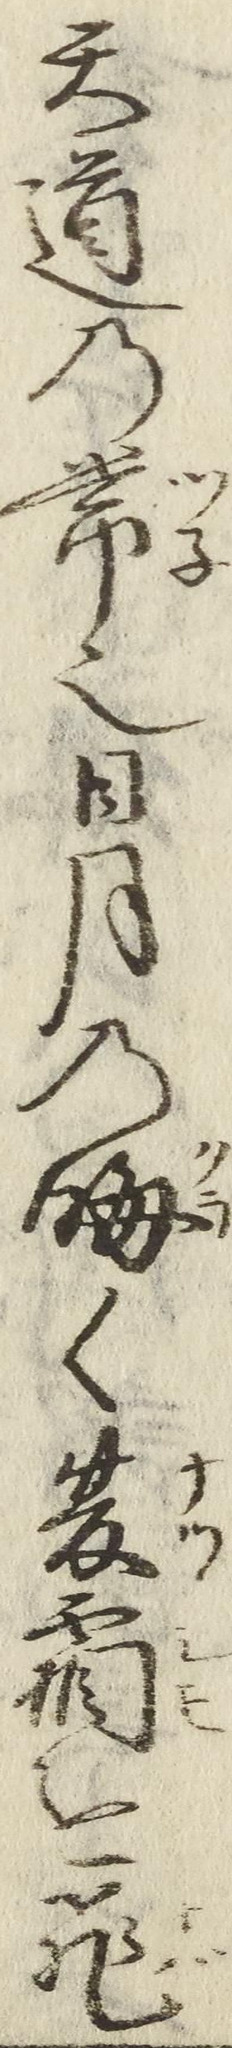天道の常也日月の晦く夏霜を飛
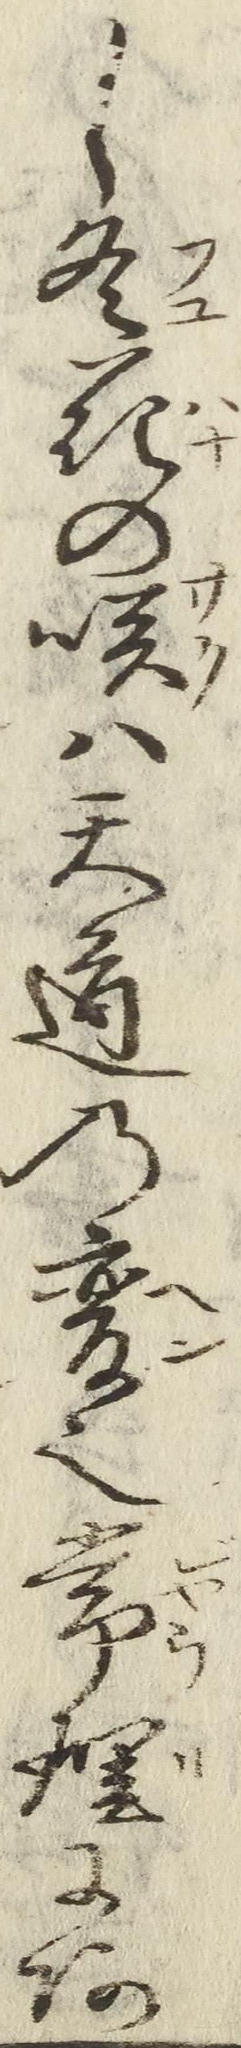し冬花の咲は天道の変也常理にあ
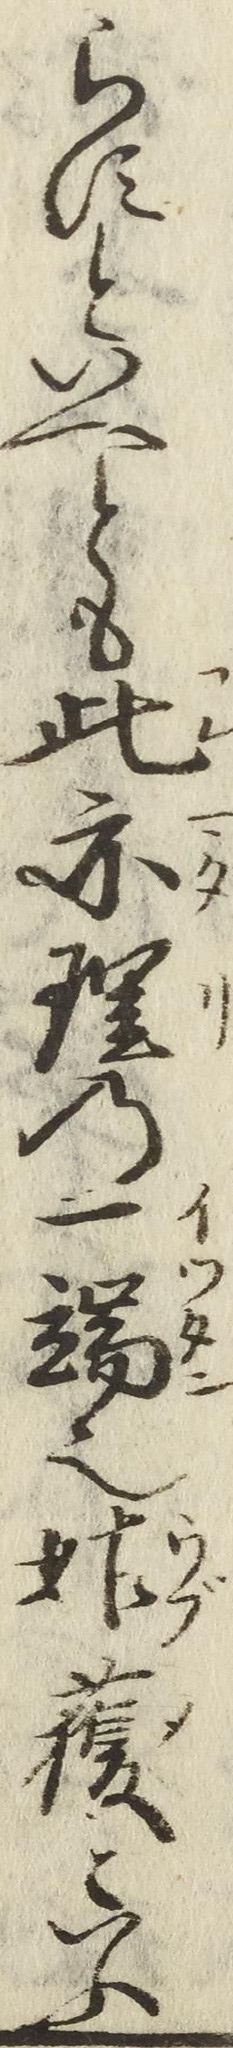らすといへとも此亦理の一端也姑獲といふ
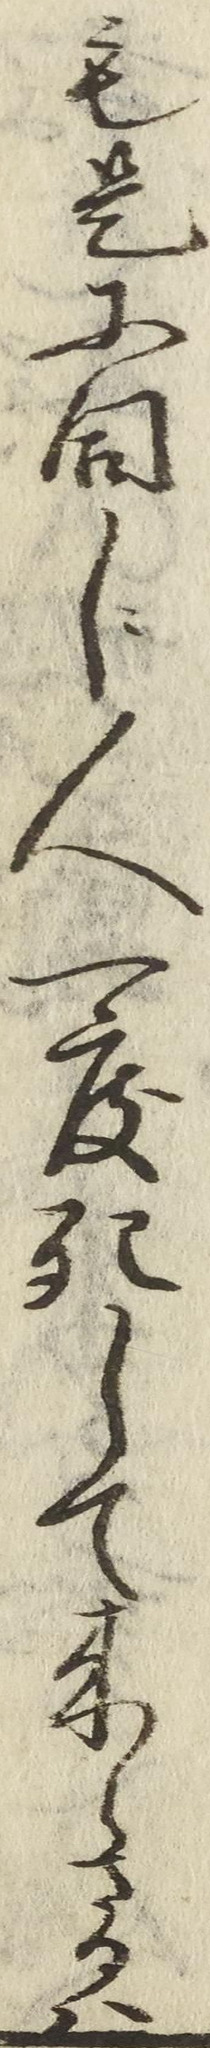も是に同じ人一度死して来らさるは

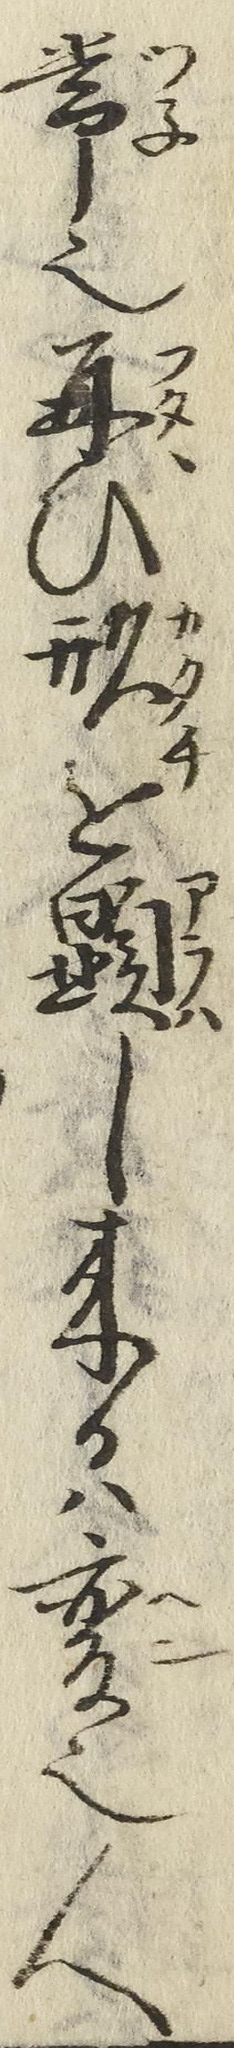常也再ひ形を顕し来るは変也人
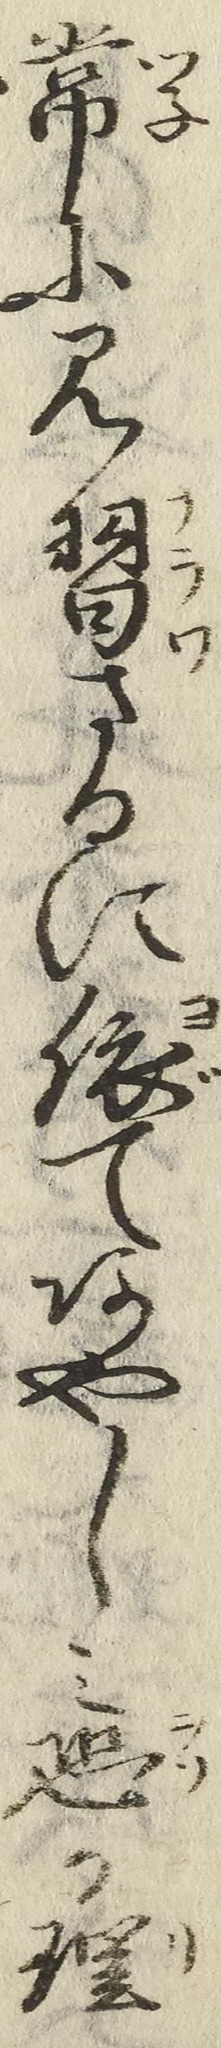常に見習さるに依てあやしみ恐る理
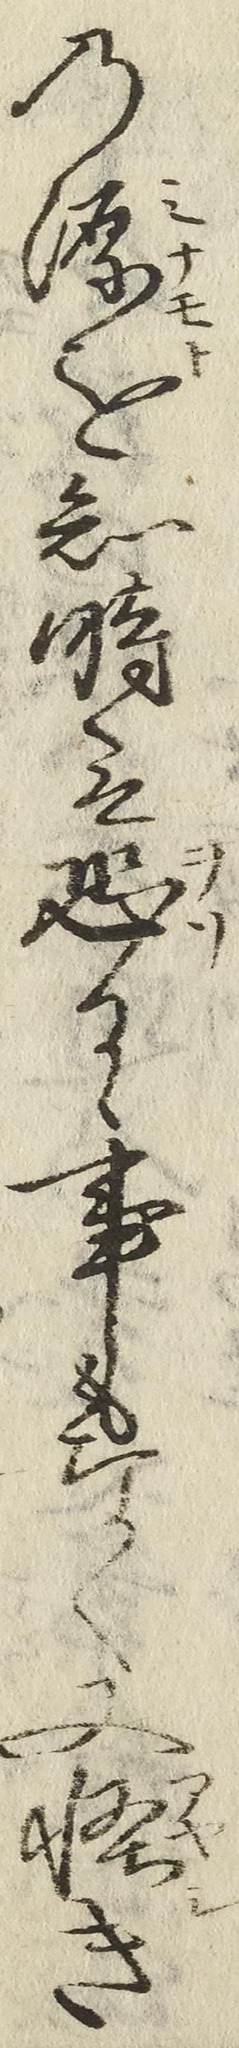の源を知時は恐るゝ事もなく又怪き
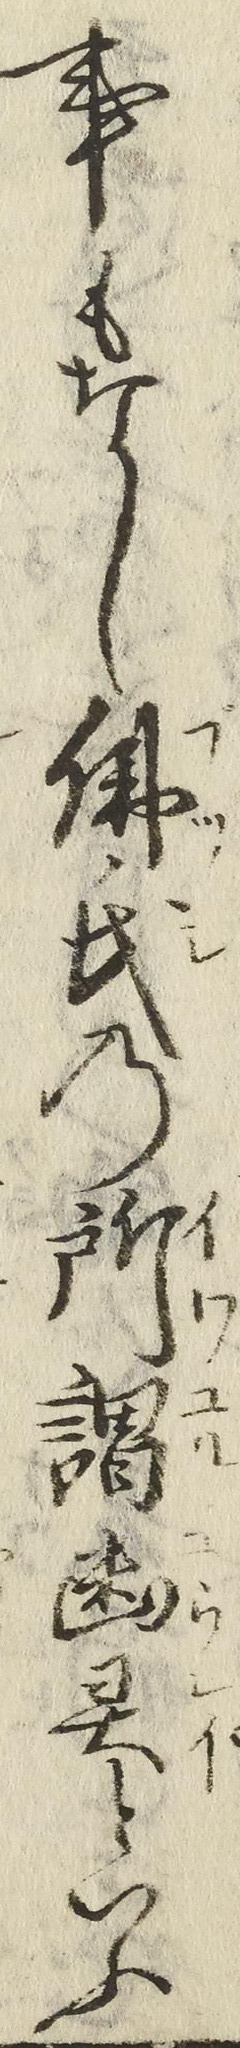事もなし仏氏の所謂幽霊といふ
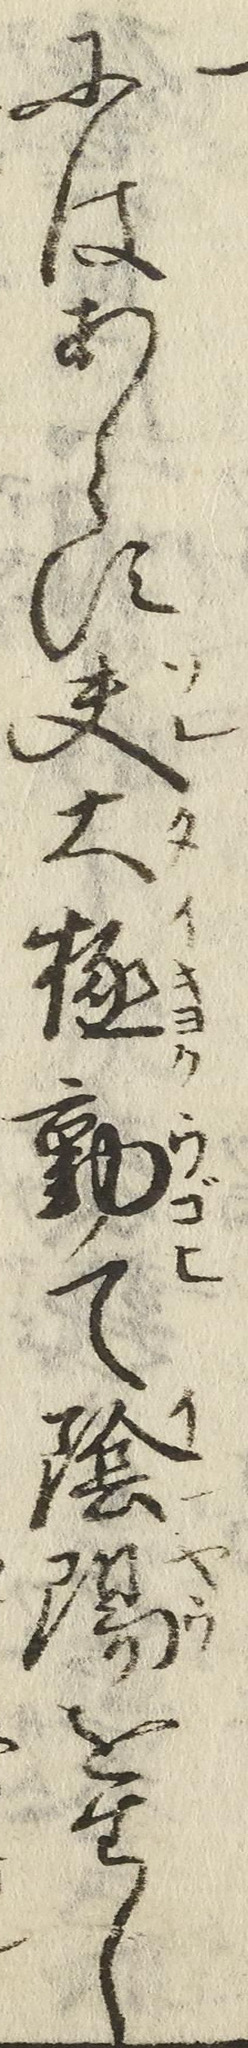にはあらす夫大極動て陰陽を生し
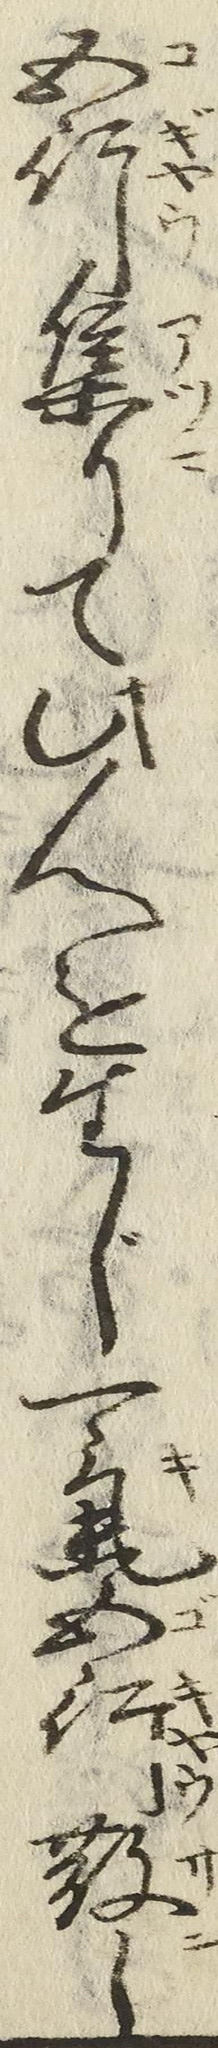五行集りて此人を生じ一気五行散し
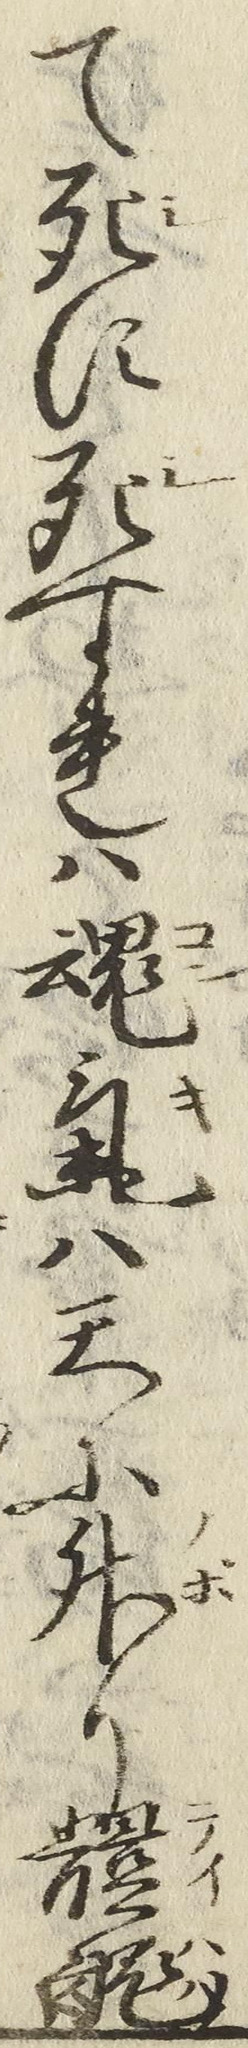て死す死すれは魂気は天に升り体魄
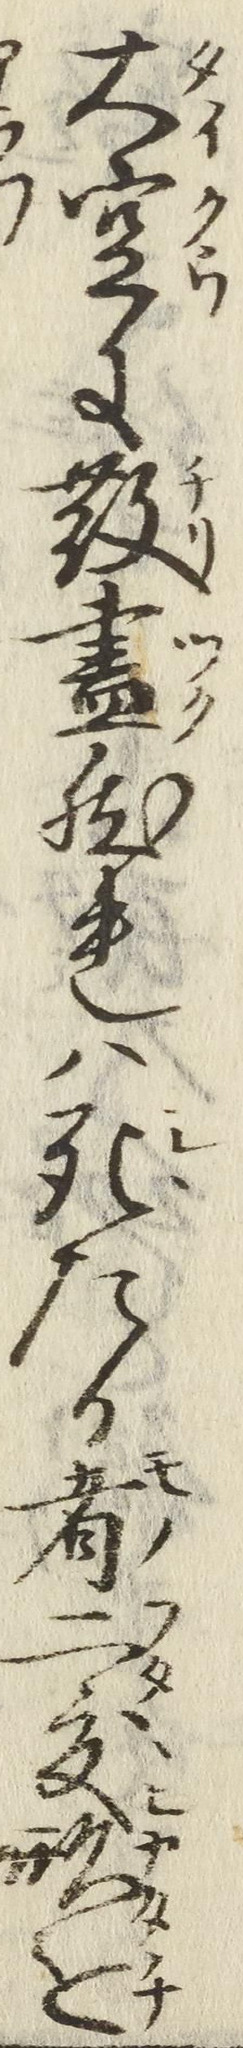大空に散尽然れは死たる者二度形を
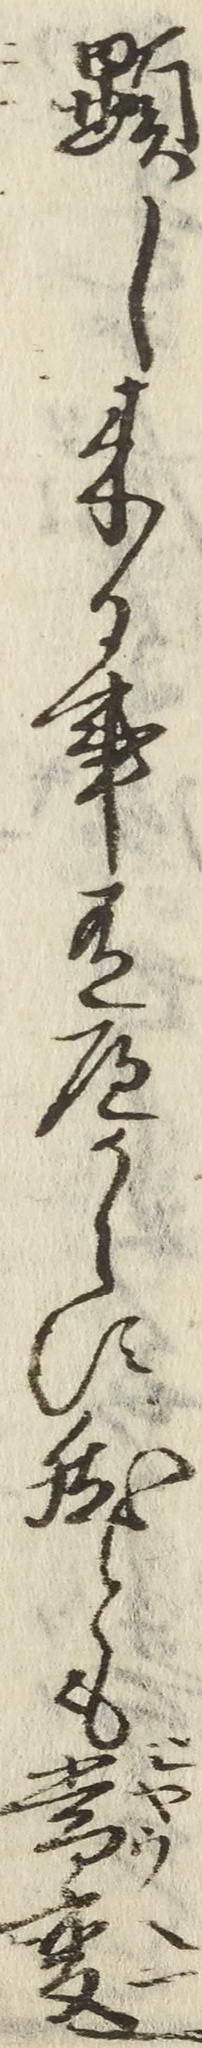顕し来る事有へからす然とも常変
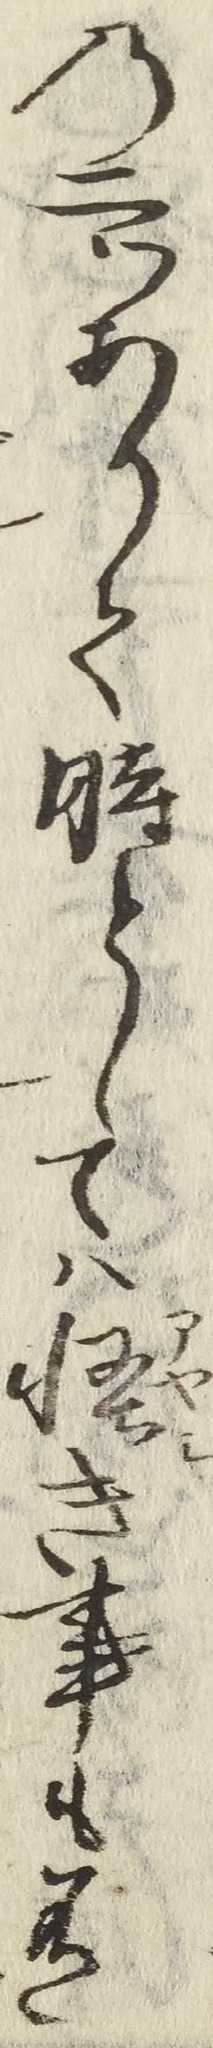の二つありて時としては怪き事も有
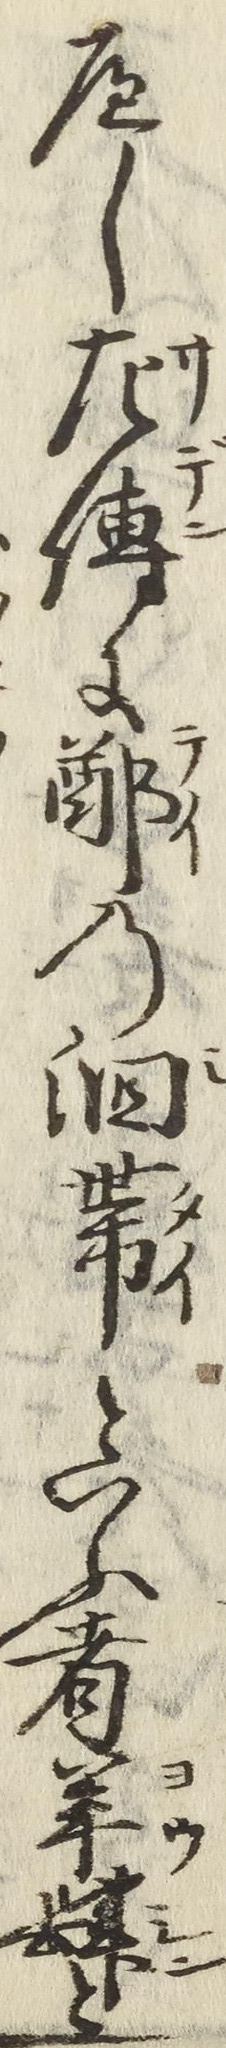へし左伝に鄭の泗帯といふ者羊肆と
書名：天地或問珍　地
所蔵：東京大学地震研究所図書室 Earthquake Research Institute Library, The University of Tokyo, JAPAN
